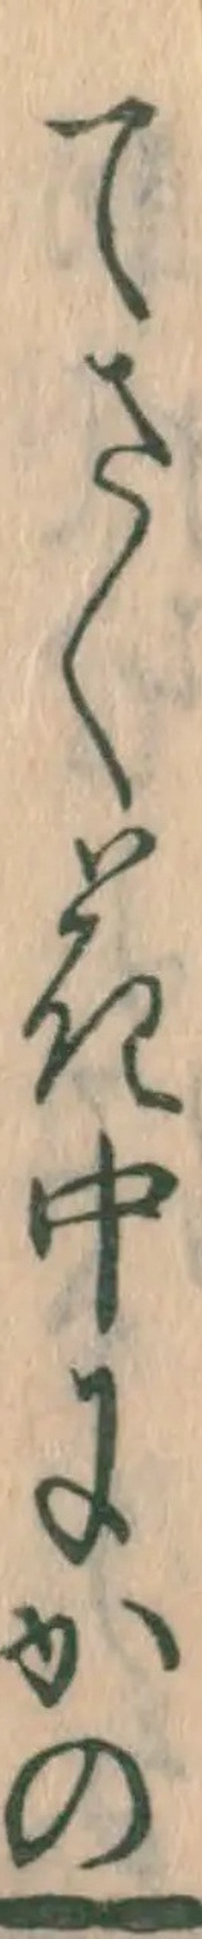てさく花中にかの
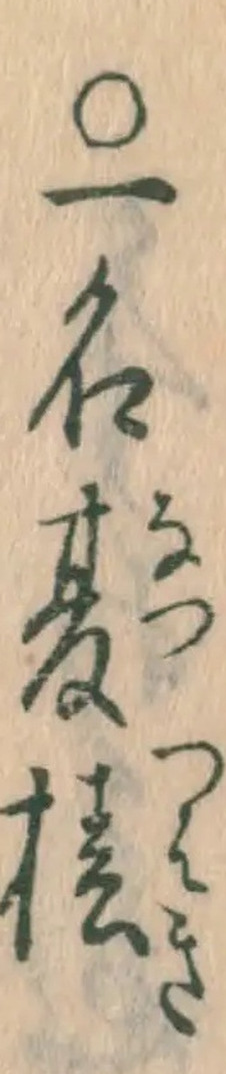○一名夏椿
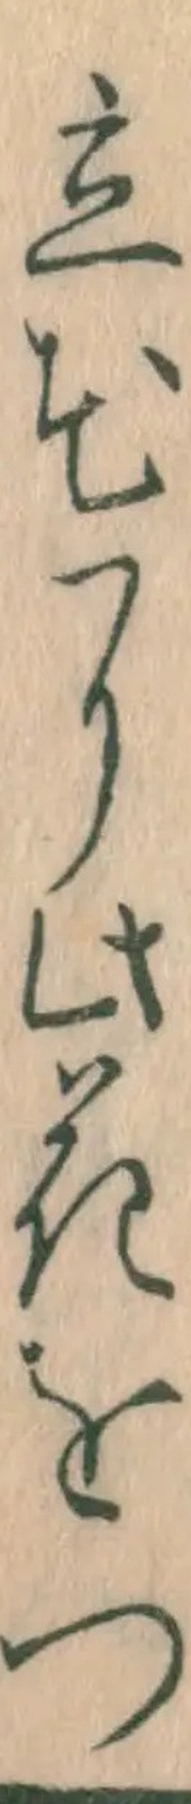立花に此花をつ
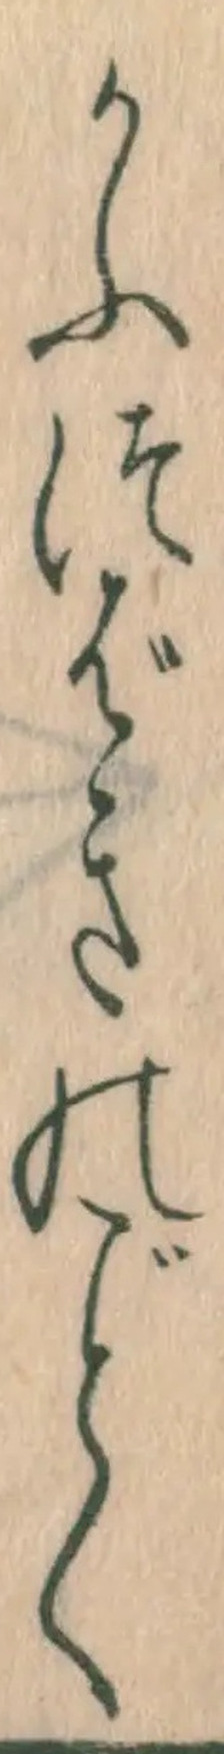かふつばきのごとく
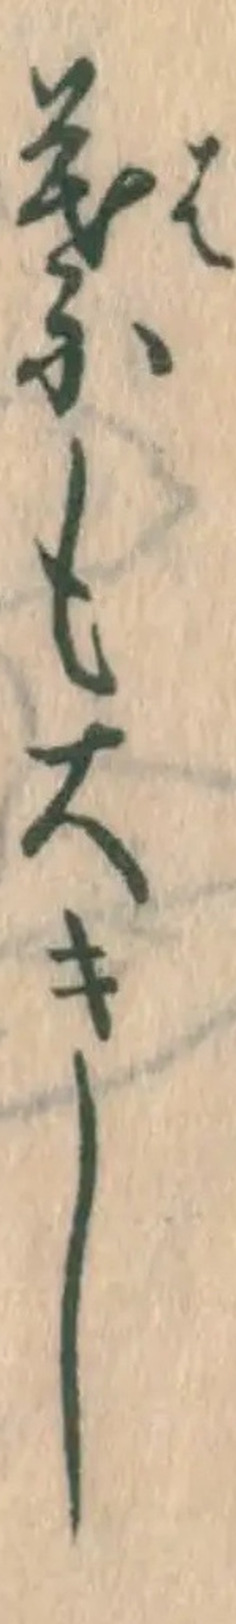葉も大きし
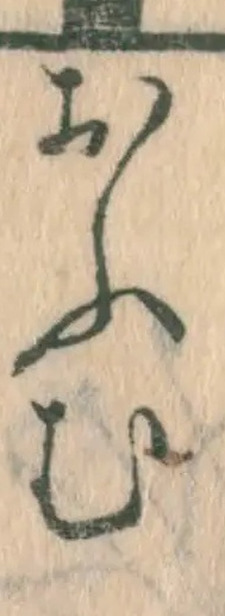おふむ
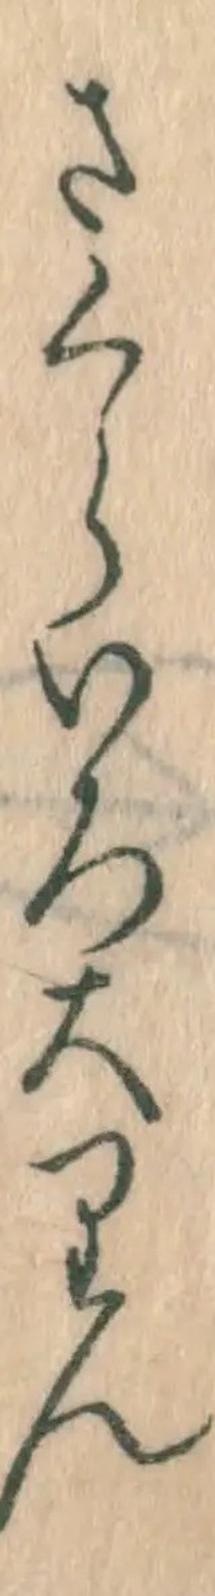さくらいろ大りん

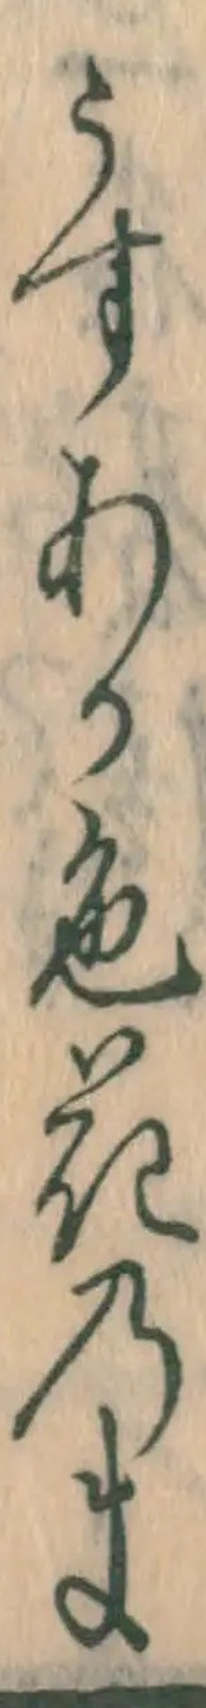うすあか色花のま
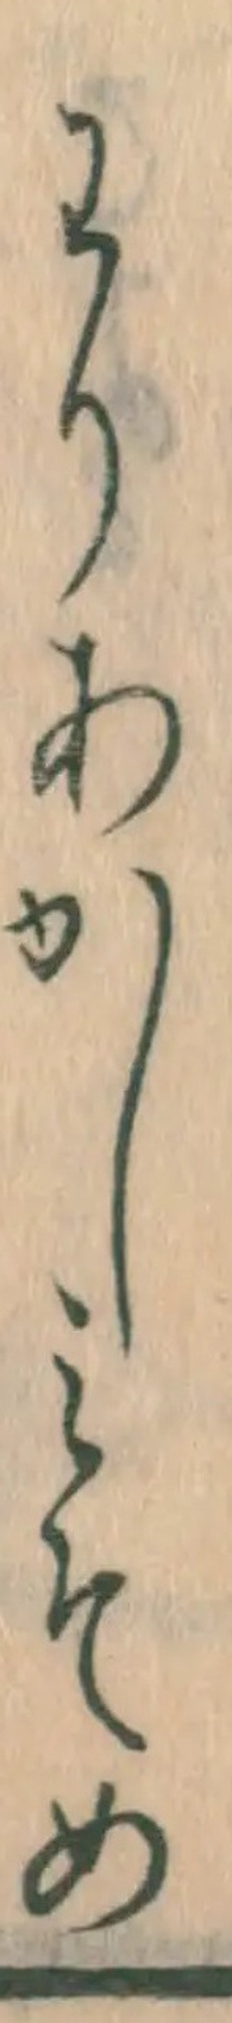わりあかしみそめ
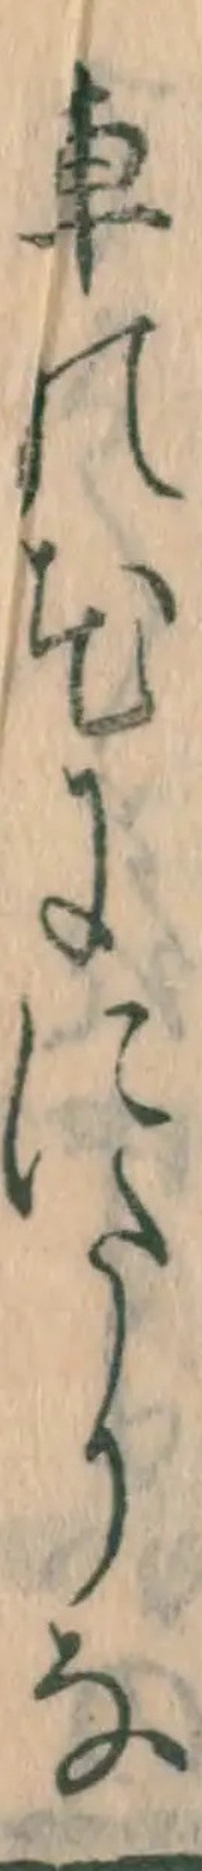車の花ににたりな
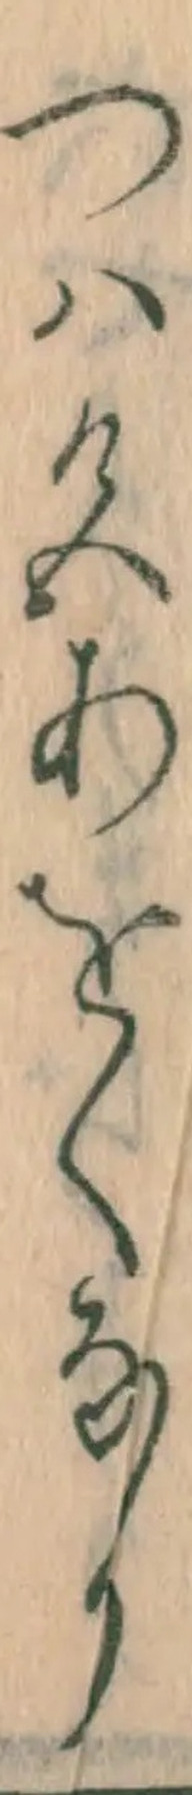つは色あをくなり
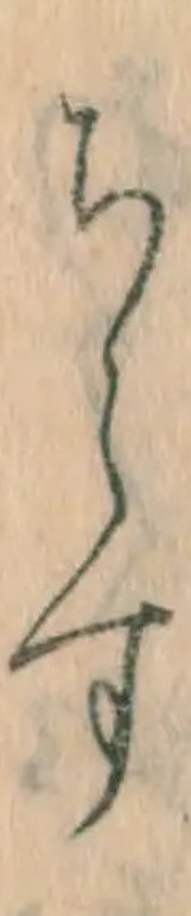ちらず
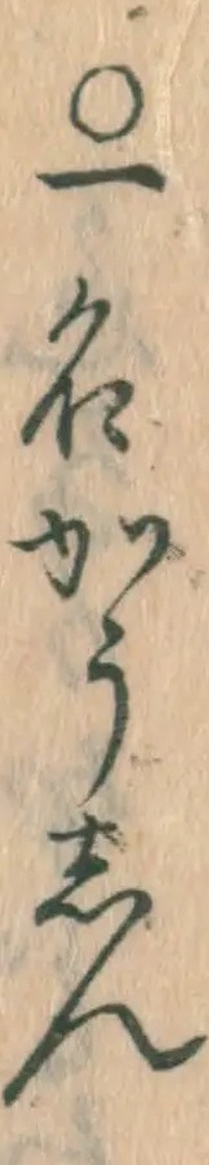一名かうしん
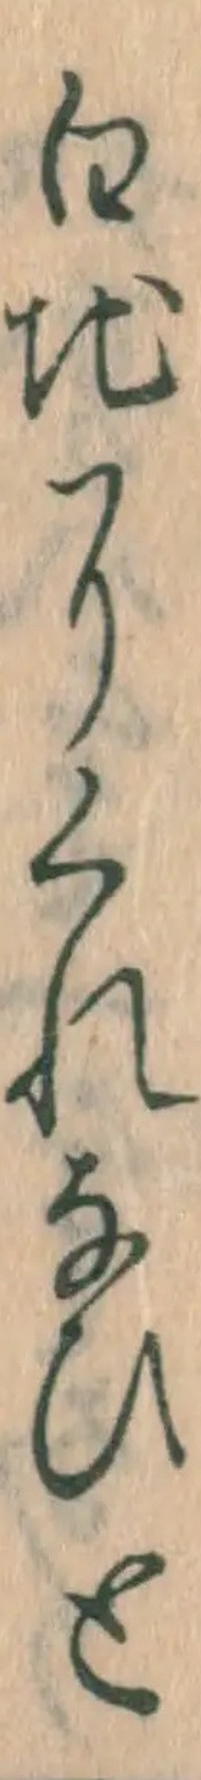白地にくれなひと
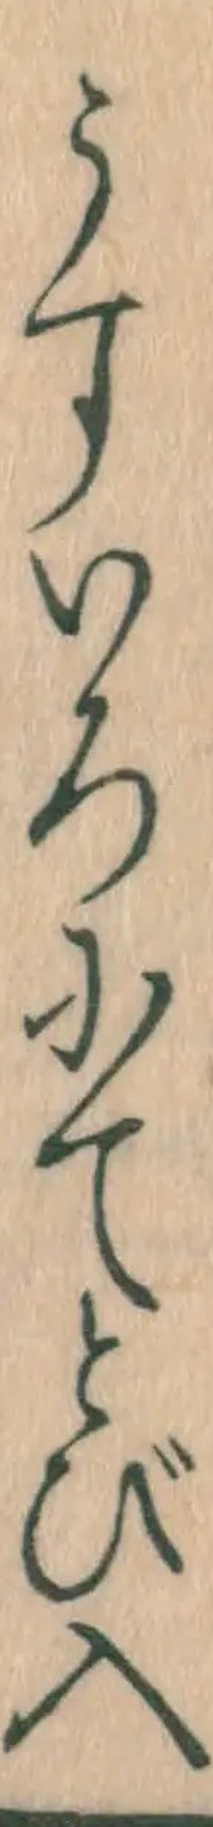うすいろにてとび入
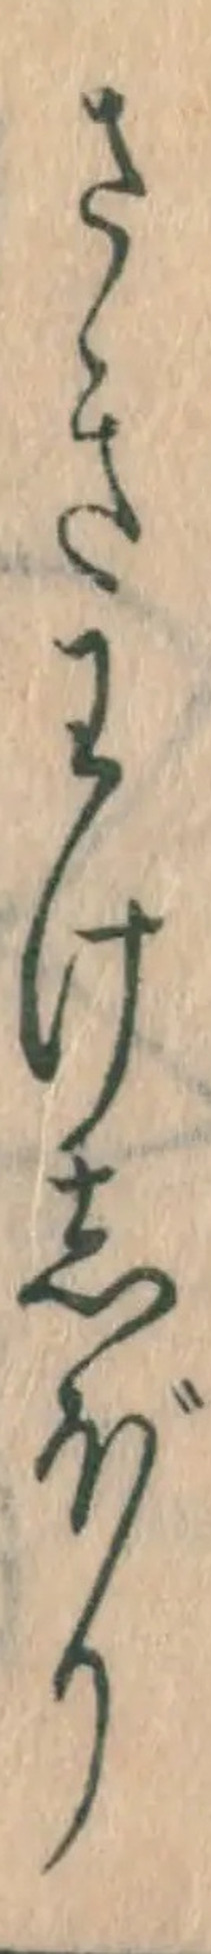さきわけしぼり
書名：錦繍枕 5巻. [3]
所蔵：国立国会図書館 National Diet Library, JAPAN
